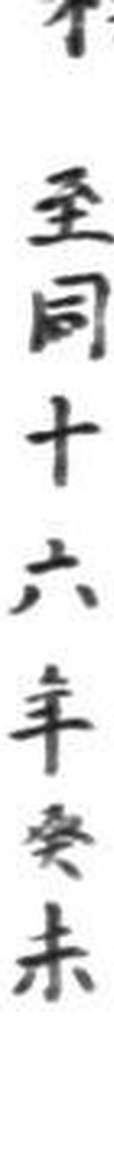至同十六年癸未

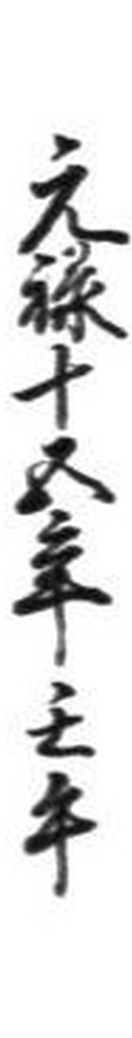元禄十五年壬午
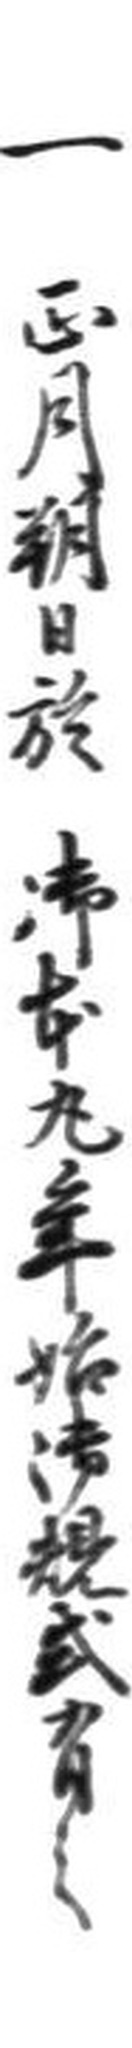一正月朔日於御本丸年始御規式有之
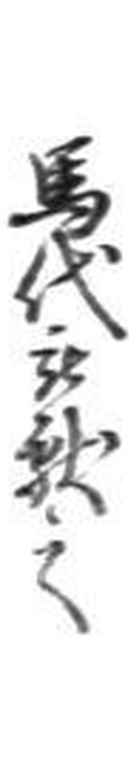馬代被献之
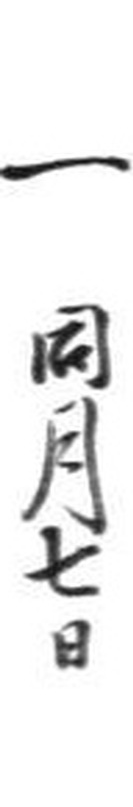一同月七日
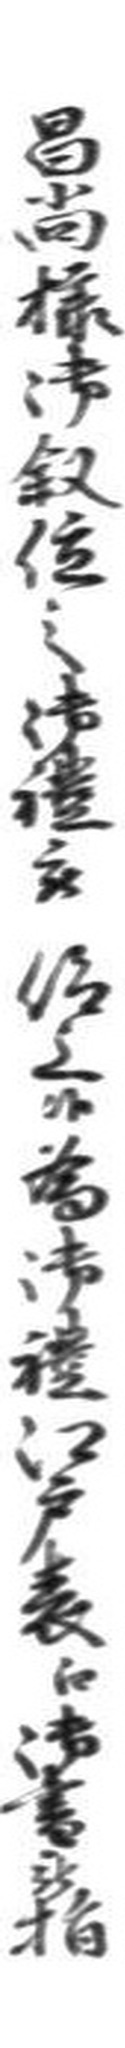昌尚様御叙位之御礼被仰上候為御礼江戸表江御書被指

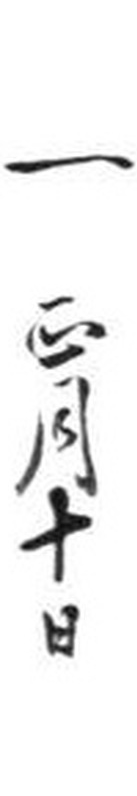一正月十日
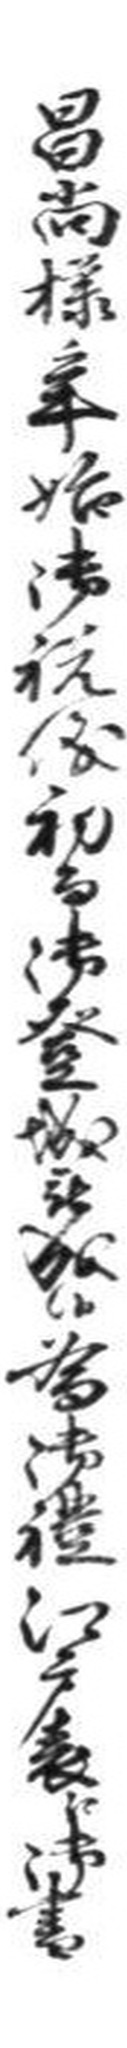昌尚様年始御祝儀初而御登城被成候為御礼江戸表江御書
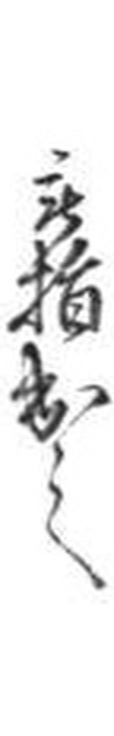被指出之
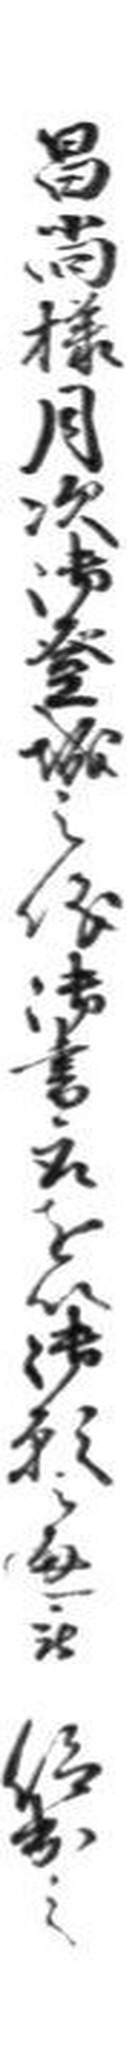昌尚様月次御登城之儀御書取を以御願之通被仰出之
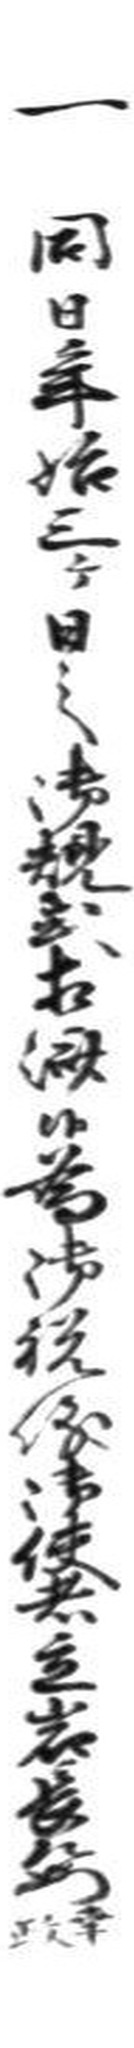一同日年始三ケ日之御規式相済候為御祝儀御使者立岩長左衛門幸政
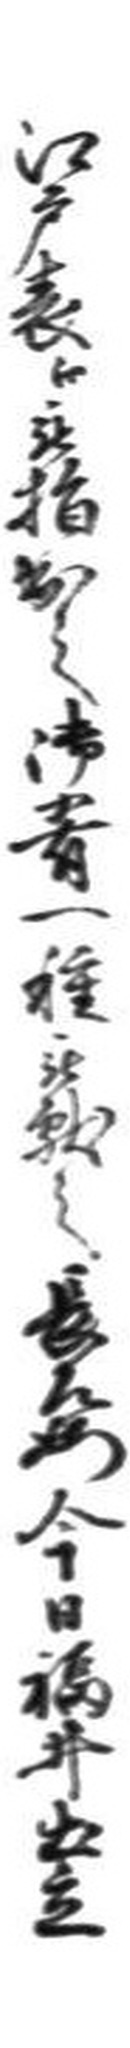江戸表江被指出之御肴一種被献之長左衛門今日福井出立
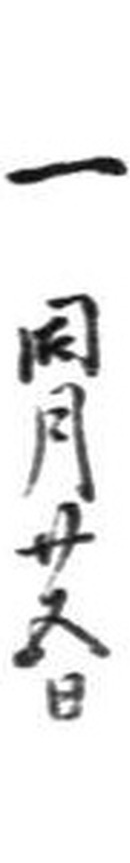一同月廿五日
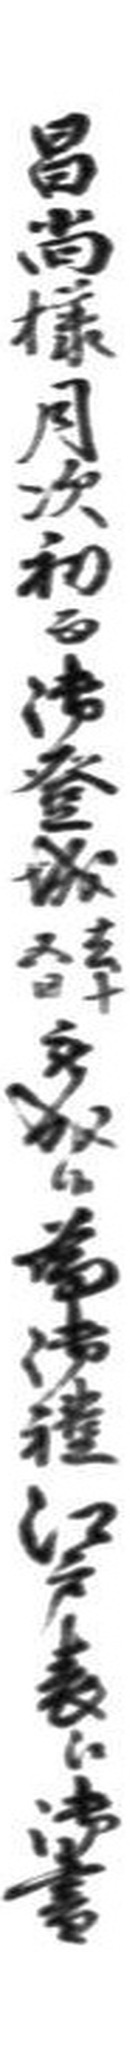昌尚様年始御祝儀初而御登城被成候為御礼江戸表江御書
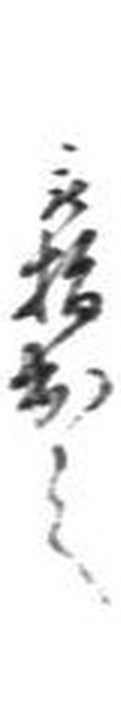被指出之
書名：家譜 二十二 吉品公 従元禄十五年到同十六年
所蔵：福井県文書館 Fukui Prefectural Archives
